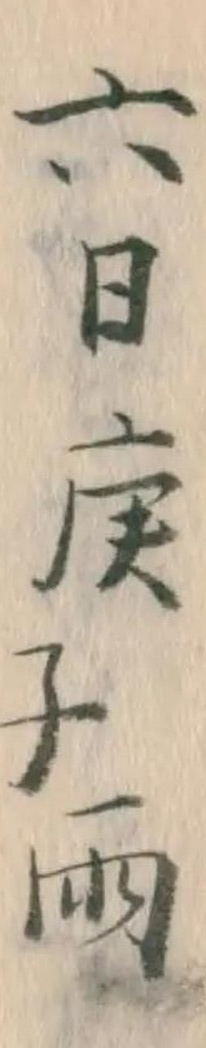六日庚子雨
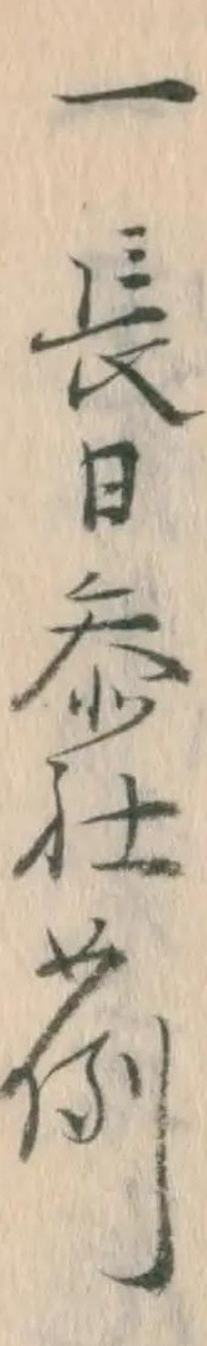一長日参社如例
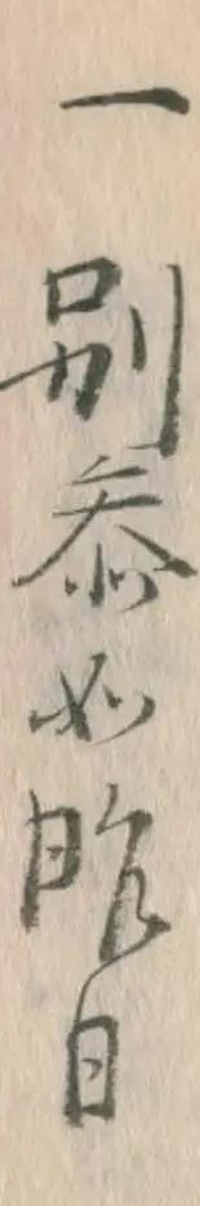一別参如昨日
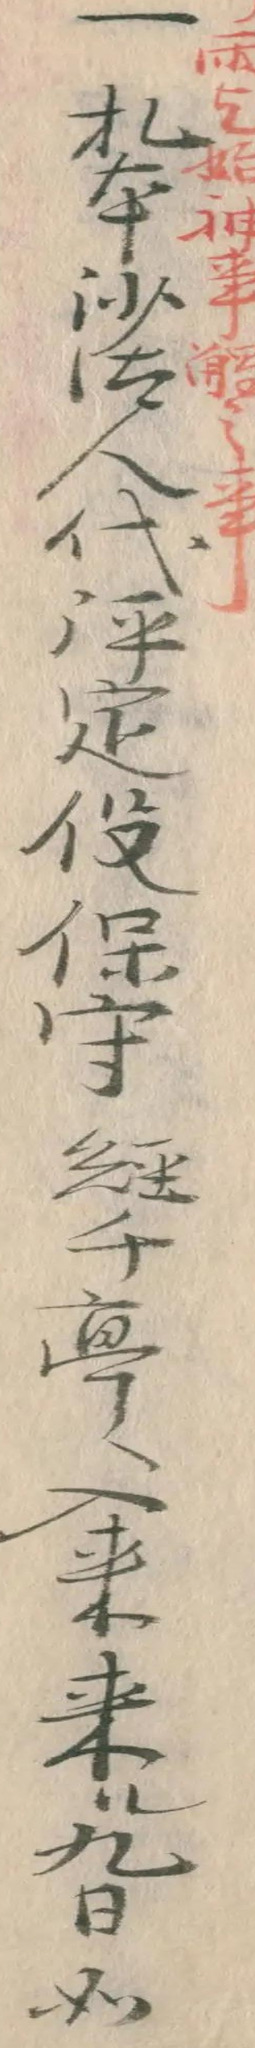一札本沙汰人代評定役保守経千亭へ入来ル九日如
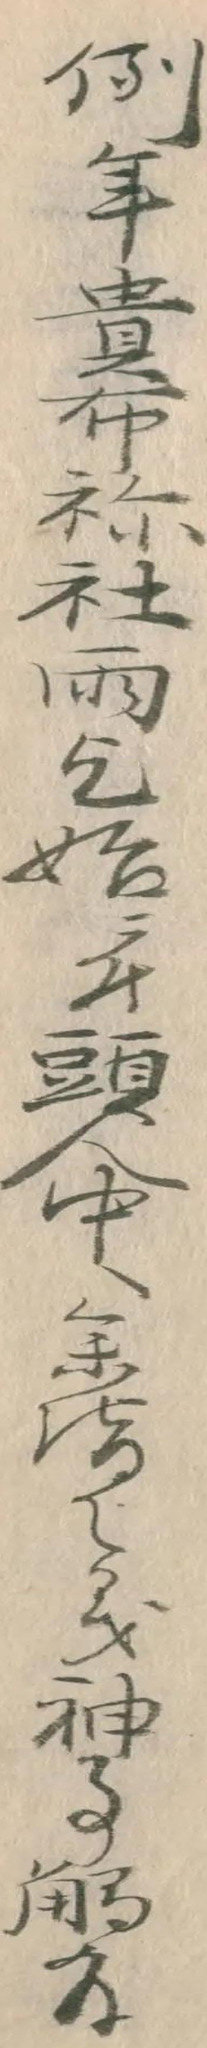例年貴布祢社雨乞始ニ付頭人中へ参詣之義神事触有
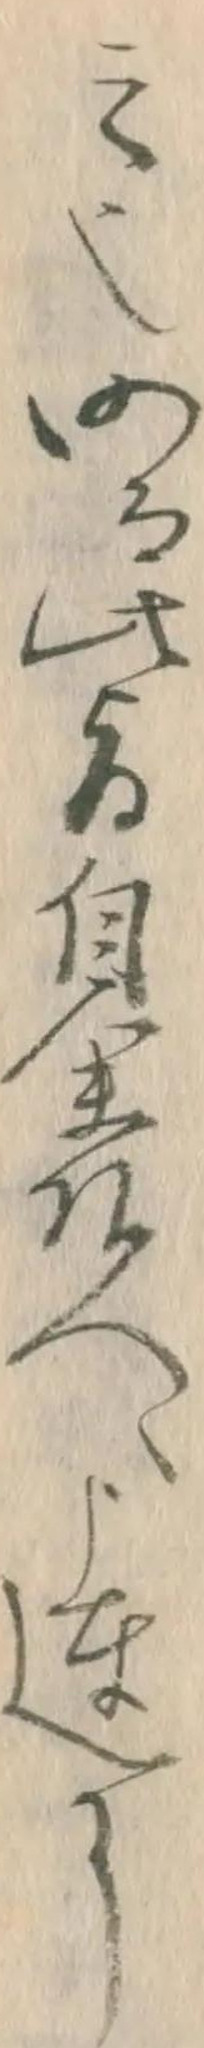之也仍而此旨自余頭人へ申達了

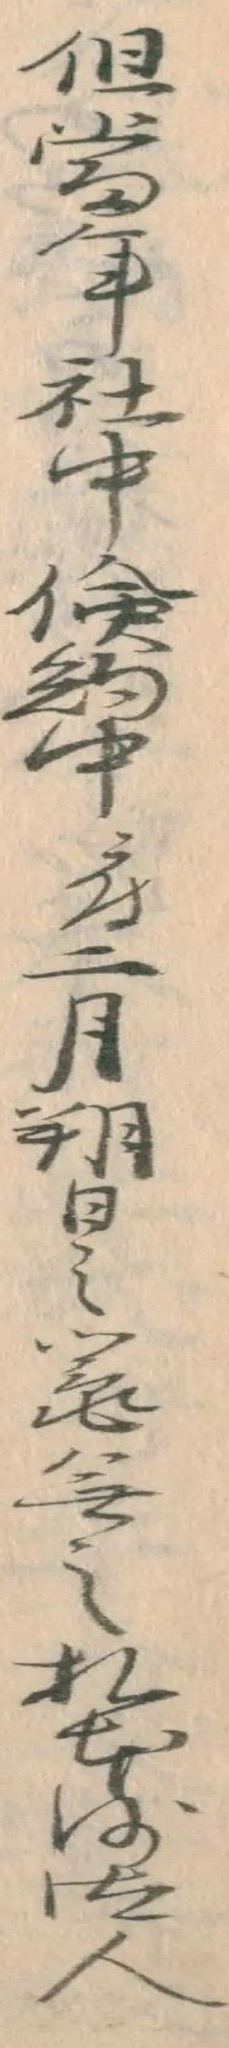但當年社中倹約中ニ付二月朔日之鬮無之札本沙汰人
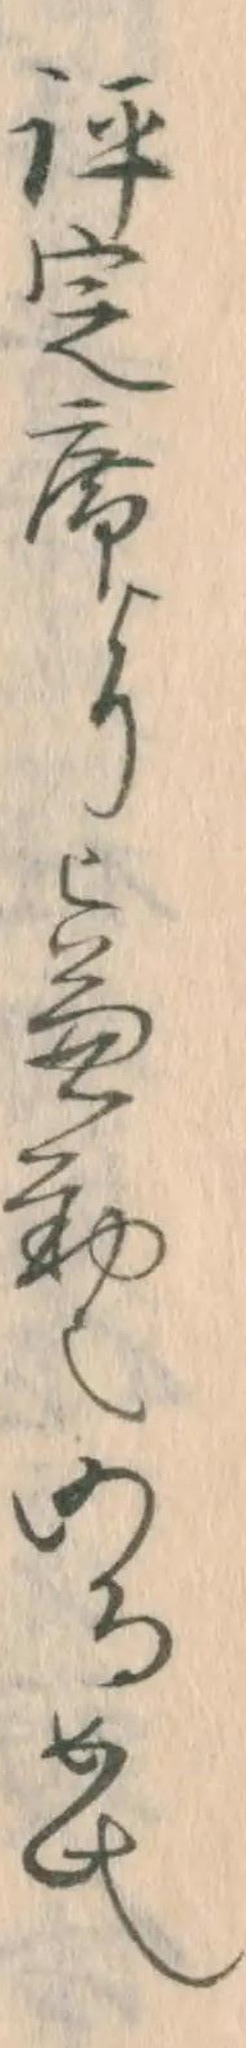評定席より被兼勤也仍而如此
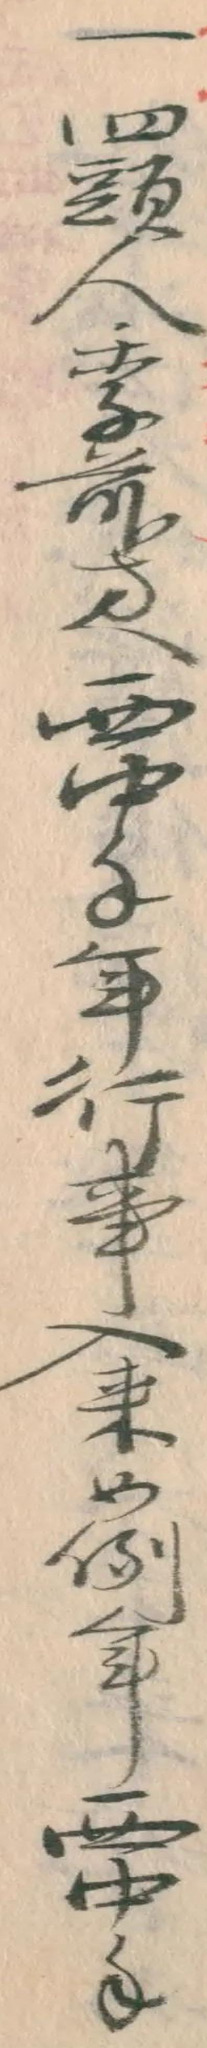一四頭人季前方へ西中手年行事入来如例年西中手
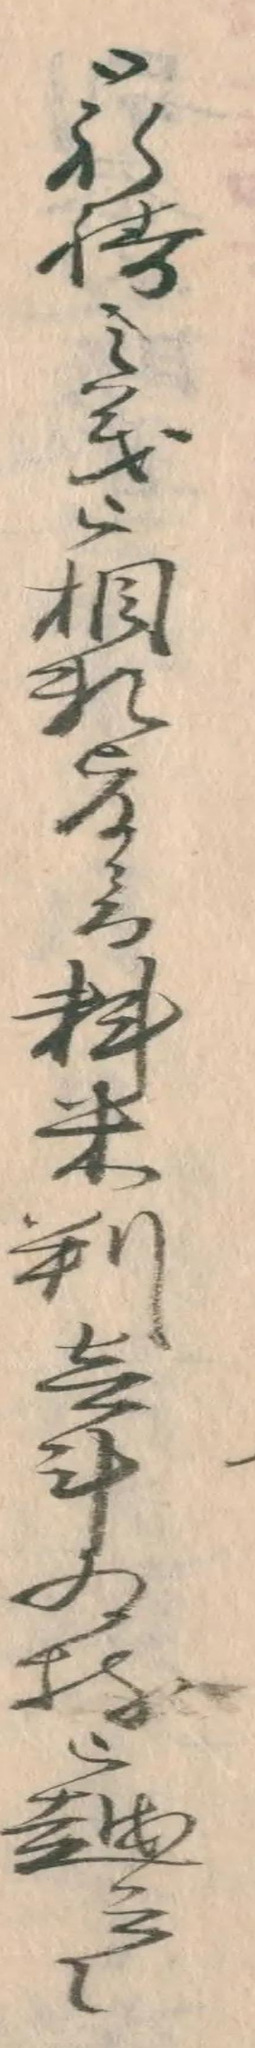御祈祷之義被相頼旨料米判壱斗為持被越云々
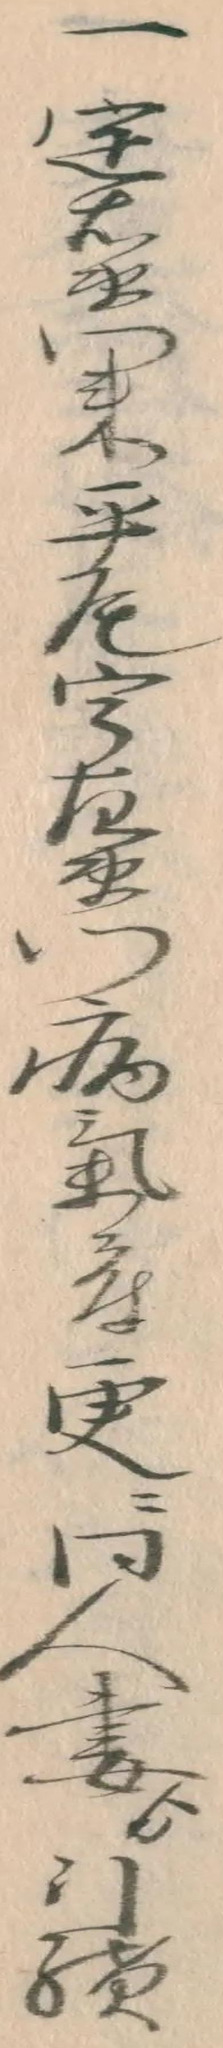一定右衛門来平尾宇左衛門病氣ニ付更ニ同人妻ゟ引續
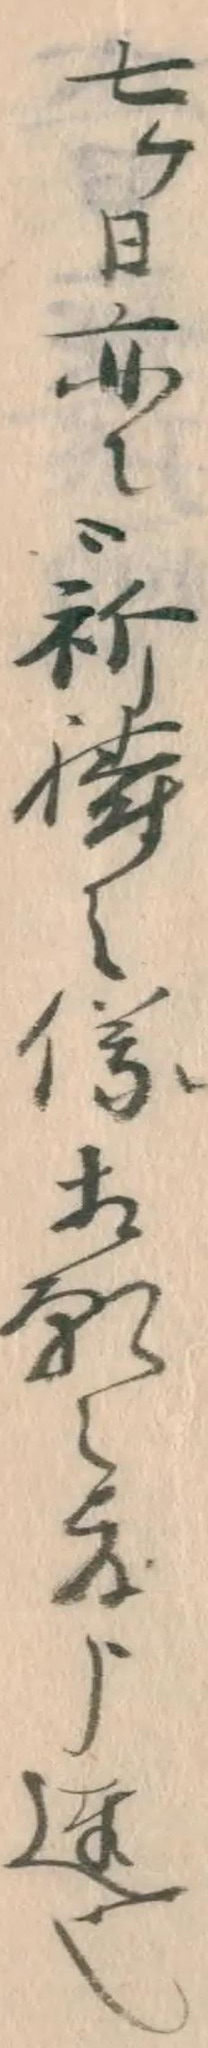七ヶ日亦々御祈祷之儀相願之旨申達也
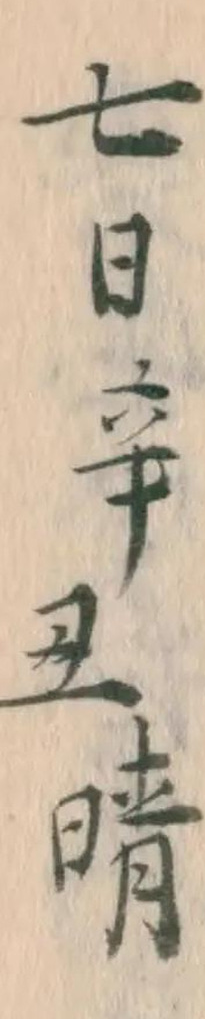七日辛丑晴
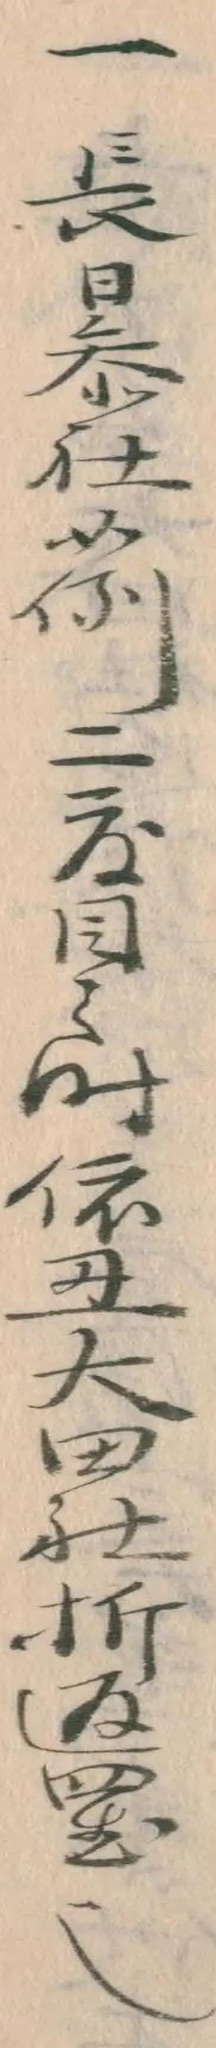一長日参社如例二度目之時依丑大田社折返画也
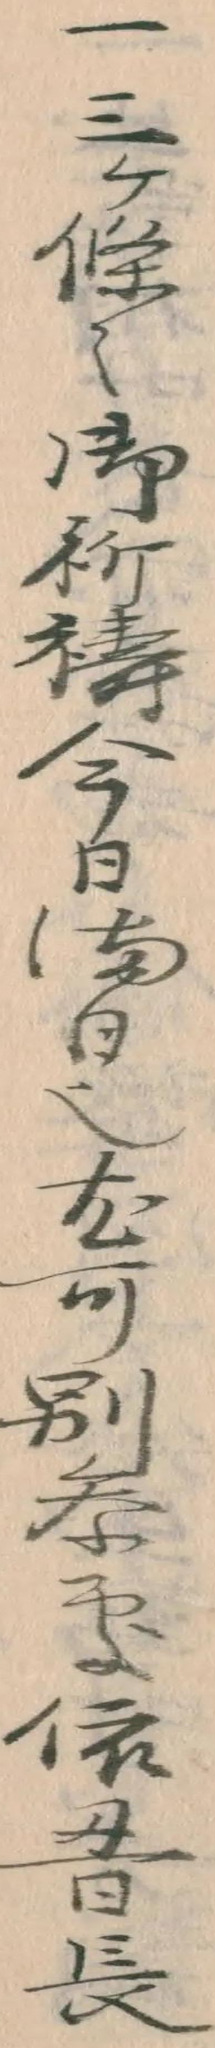一三ケ條之御祈祷今日満日也尤可別参處依丑日長
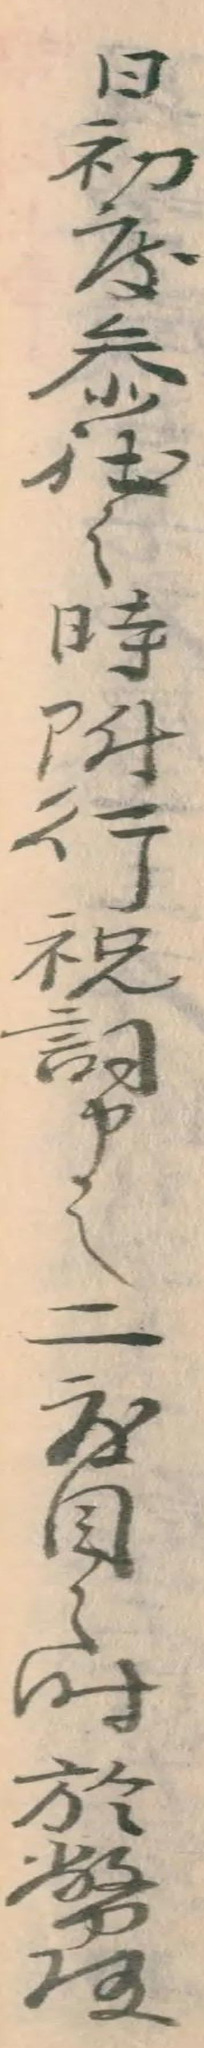日初度参社之時附行祝詞申也二度目之時於幣殿
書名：賀茂社記録. 第72冊
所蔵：国立国会図書館 National Diet Library, JAPAN
